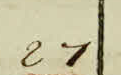27
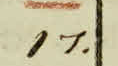17.
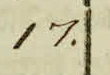17.
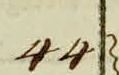44
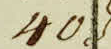40
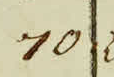70
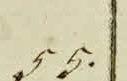55.
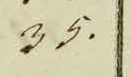35.
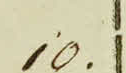10.
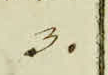3.
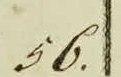56.
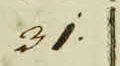31.
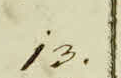13.
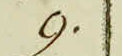9.
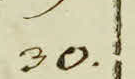30.
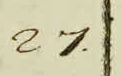27.
